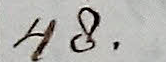48.
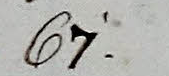67.
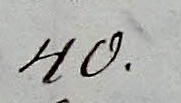40.
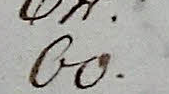60.
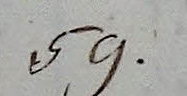59.
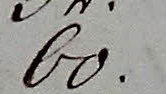60.
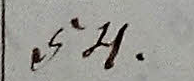54.
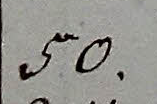50.
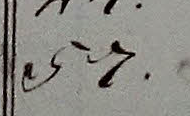57.
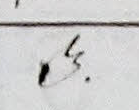3.
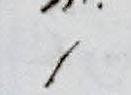1
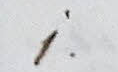1.
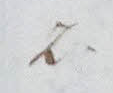2
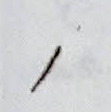1
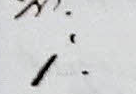1.
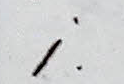1.
